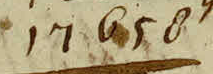17658
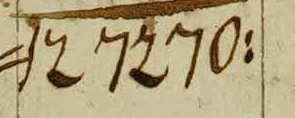127270:
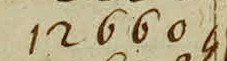12660
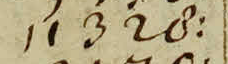11328
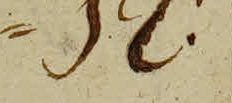12:
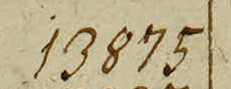13875
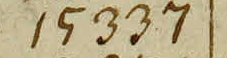15337
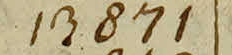13871
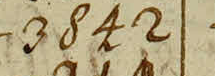3842
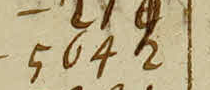5642
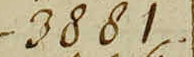3881
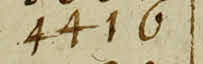4416
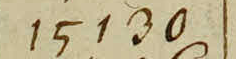15130
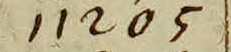11205
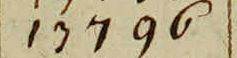13796
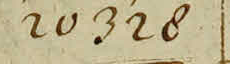20328
